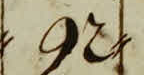92
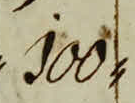100
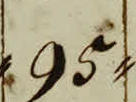95
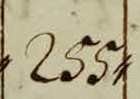255
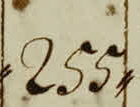255
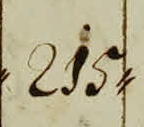215
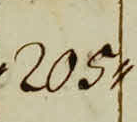205
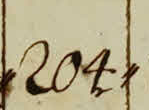204
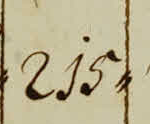215
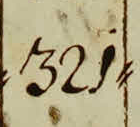321
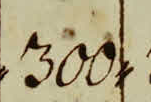300
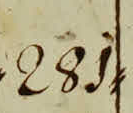281
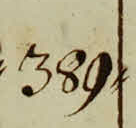389
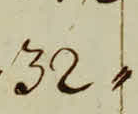32
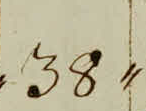38
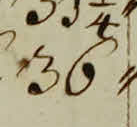36
